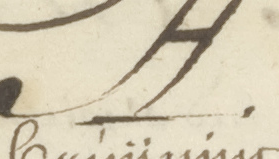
H.
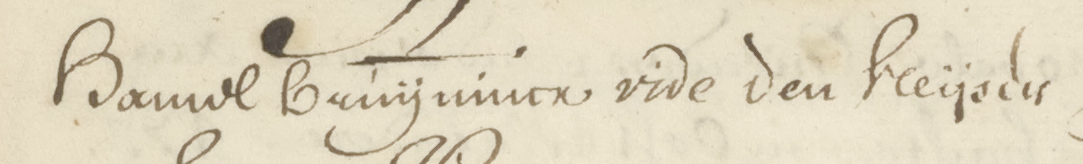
Hamel Bruijnincx vide den Keijser
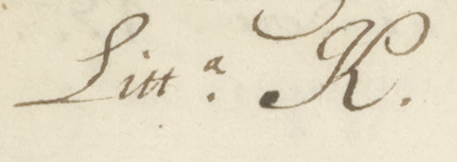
Litta. K.
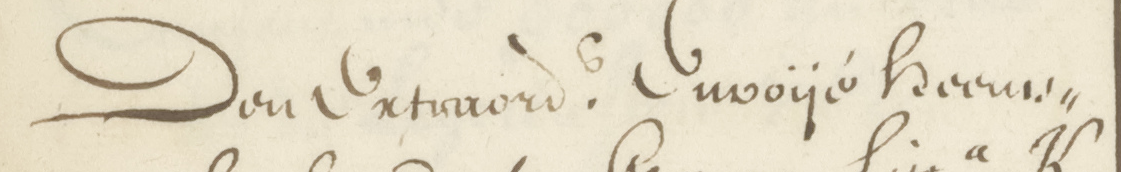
Den Extraords. Envoijé Heems„
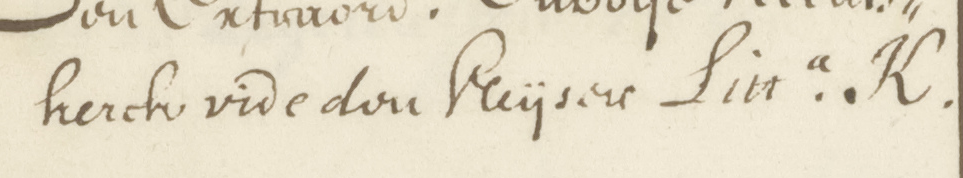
kerck vide den Keijser Litta. K.
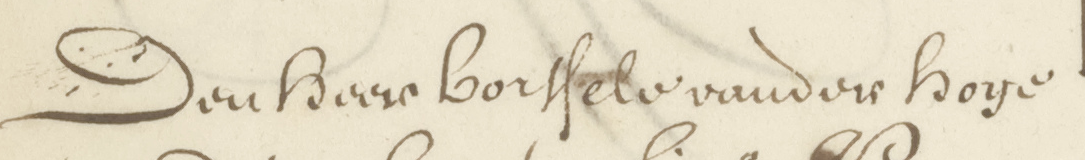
Den Heer Borssele van der Hoge
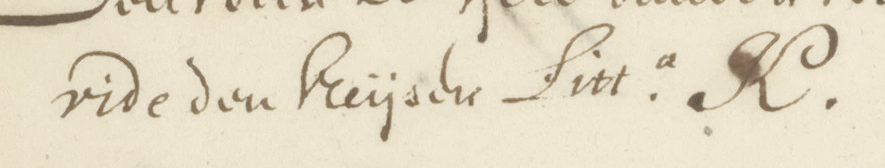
vide den Keijser Litta. K.
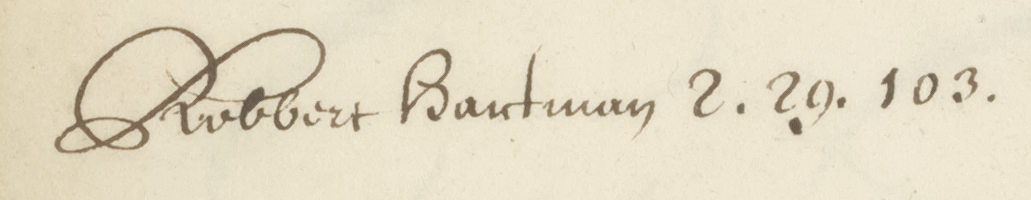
Robbert Hartman 2. 29. 103.
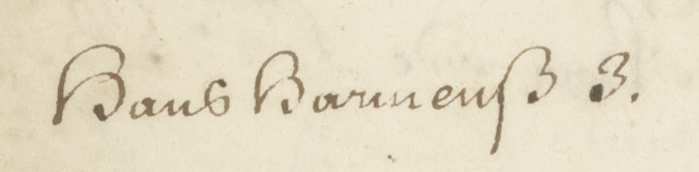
Hans Harmens 3.
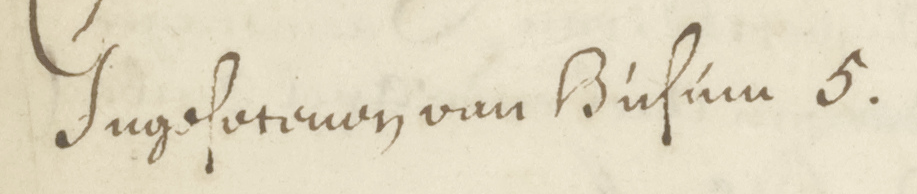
Ingesetenen van Husum 5.
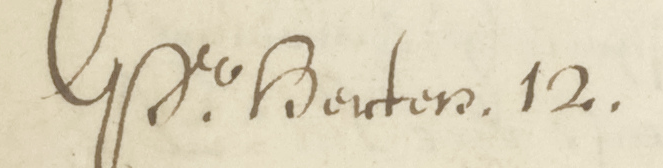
Pr. Herten 12.
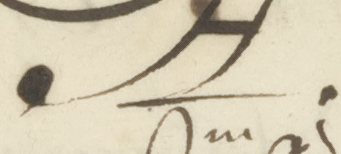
H.
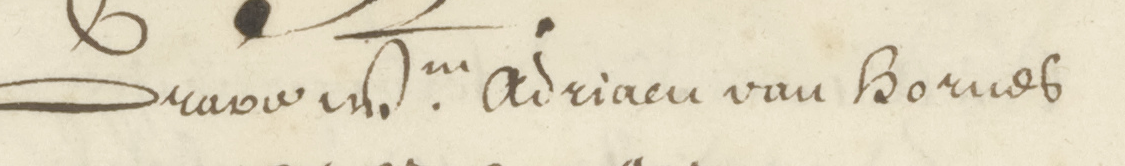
Grave Wm. Adriaen van Hornes
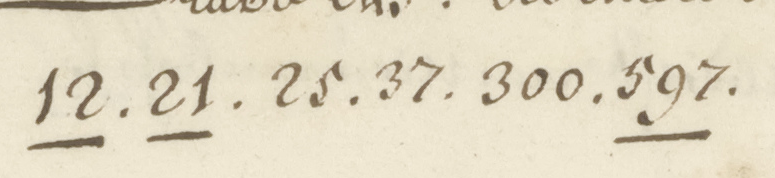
12. 21. 25. 37. 300. 597.
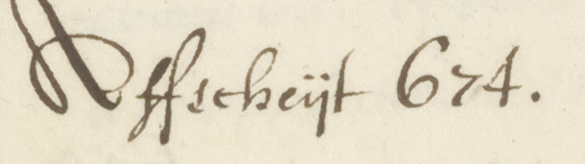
Affscheijt 674.
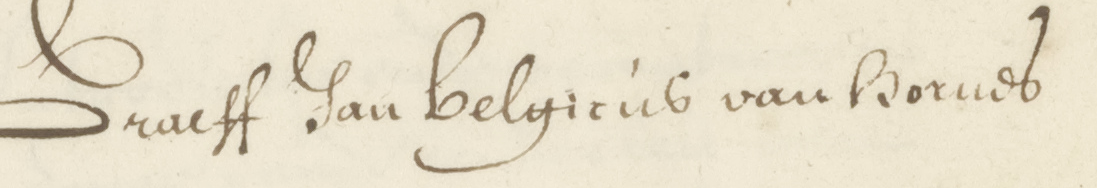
Graeff Jan Belgicus van Hornes
